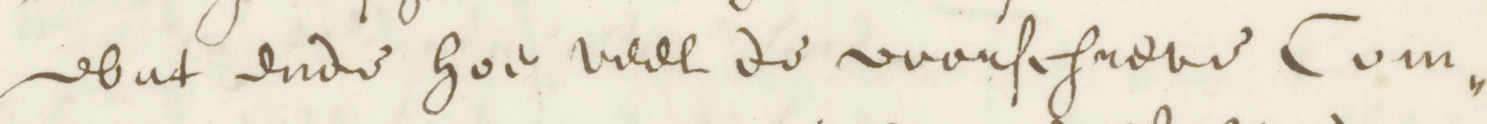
wat ende hoe veel de voorschreve Com„
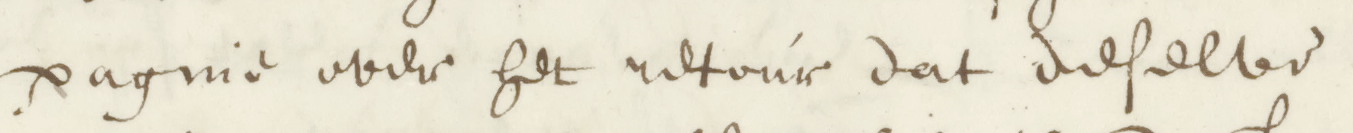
pagnie over het retour dat deselve
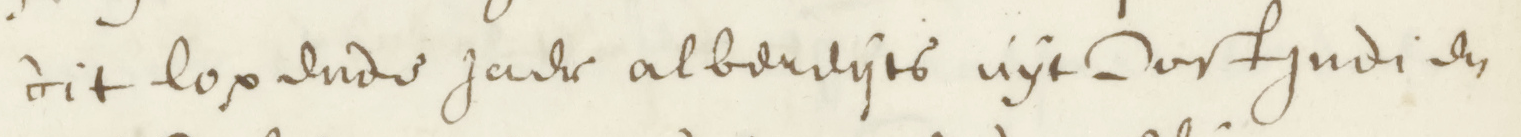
dit lopende jaer albereijts uijt Oostindien
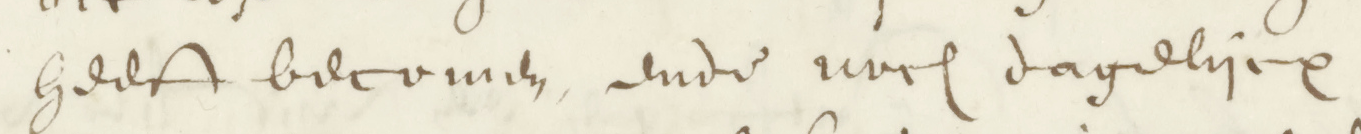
heeft becomen, ende noch dagelijcx
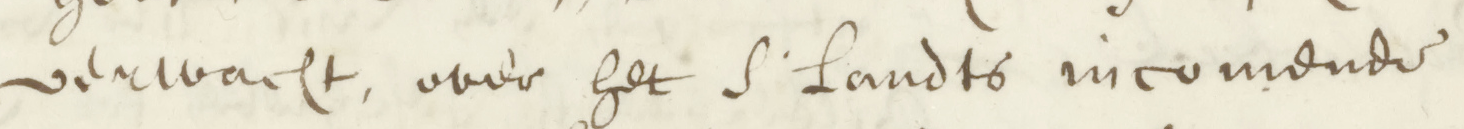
verwacht, over het s'Landts incomende
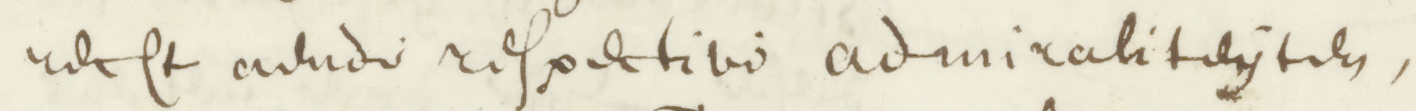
recht aende respective admiraliteijten,
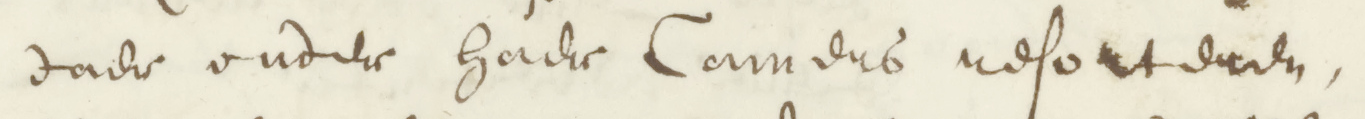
daer onder haer Camers resorteren,
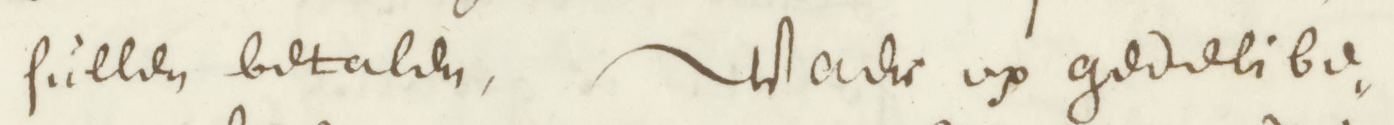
sullen betalen. Waer op gedelibe„
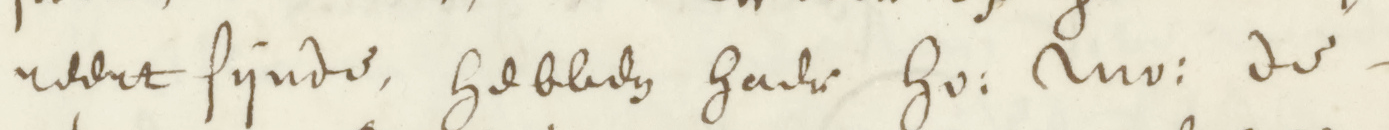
reert sijnde, hebben haer ho:mo: de
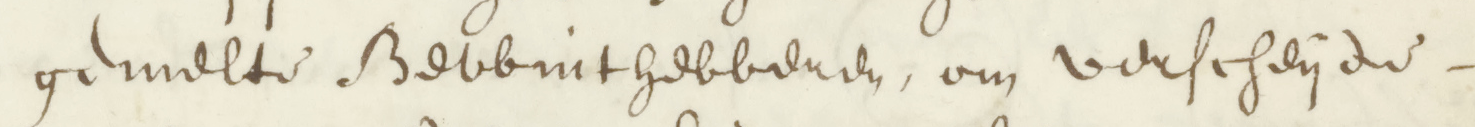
gemelte Bewinthebberen, om verscheijde
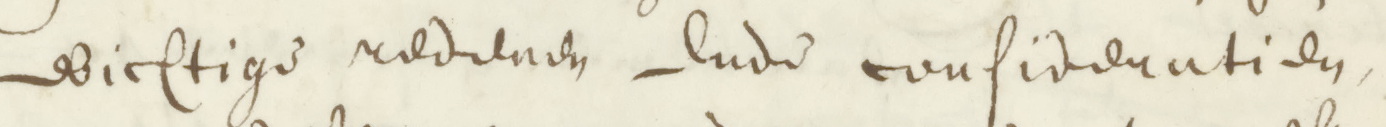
wichtige redenen ende consideratien,
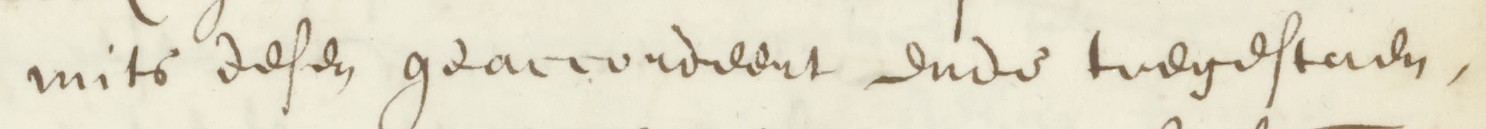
mits desen geaccordeert ende toegestaen,
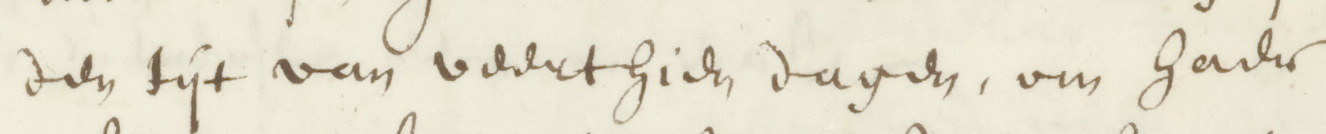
den tijt van veerthien dagen, om haer
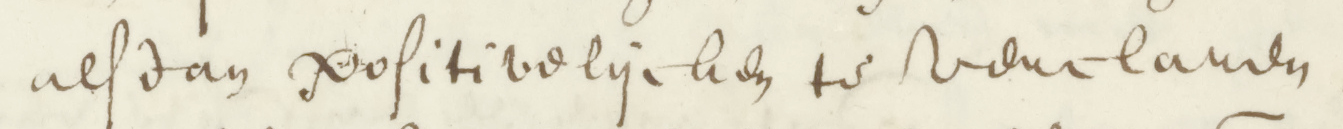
alsdan positivelijcken te verclaren
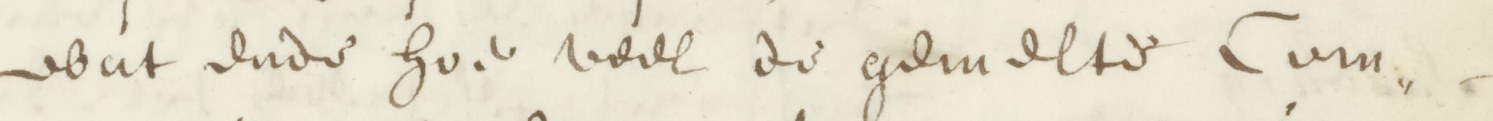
wat ende hoe veel de gemelte Com„
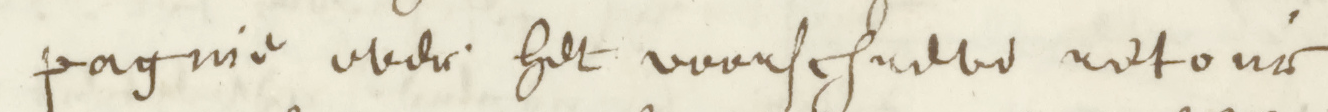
pagnie over het voorschreve retour
